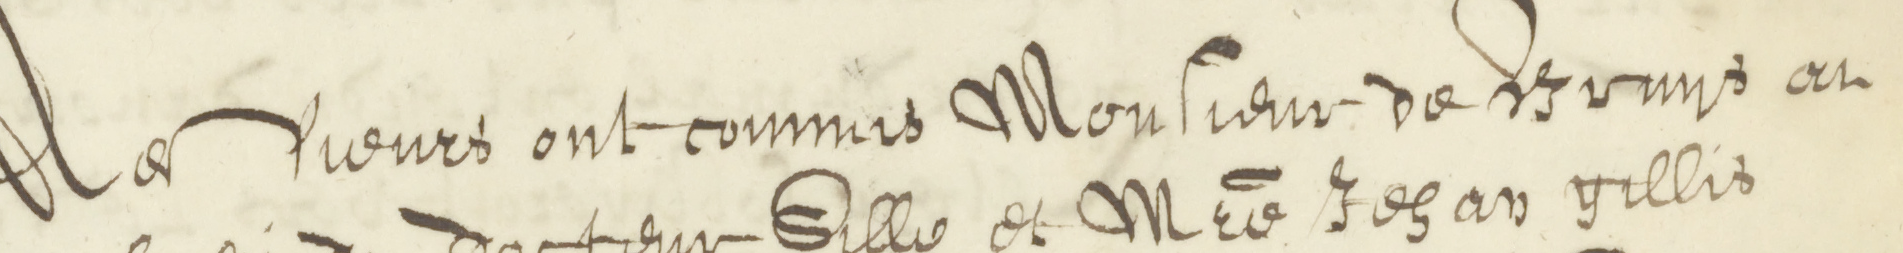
Messieurs ont commis Monsieur de Bruys au
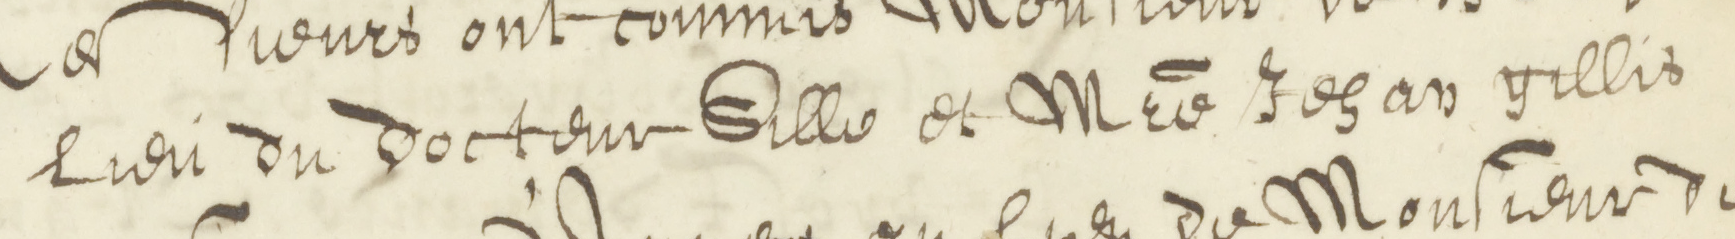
lieu du docteur Sille et Mre Jehan gillis
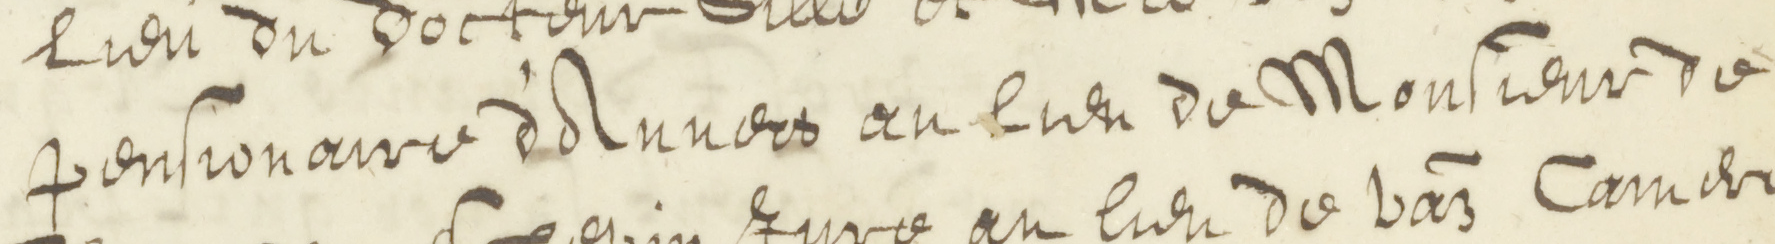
pensionaire d‛Anvers au lieu de Monsieur de
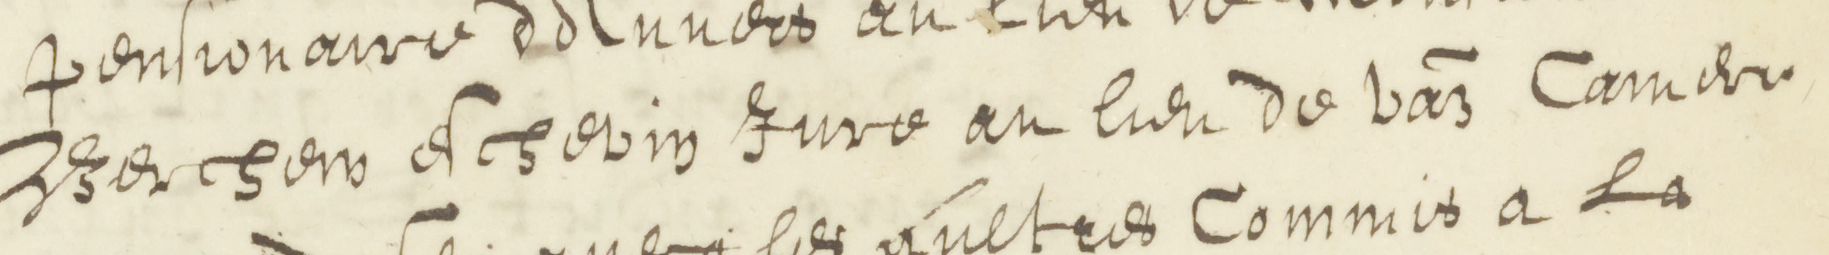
Berchem eschevin Jure au lieu de van Camere
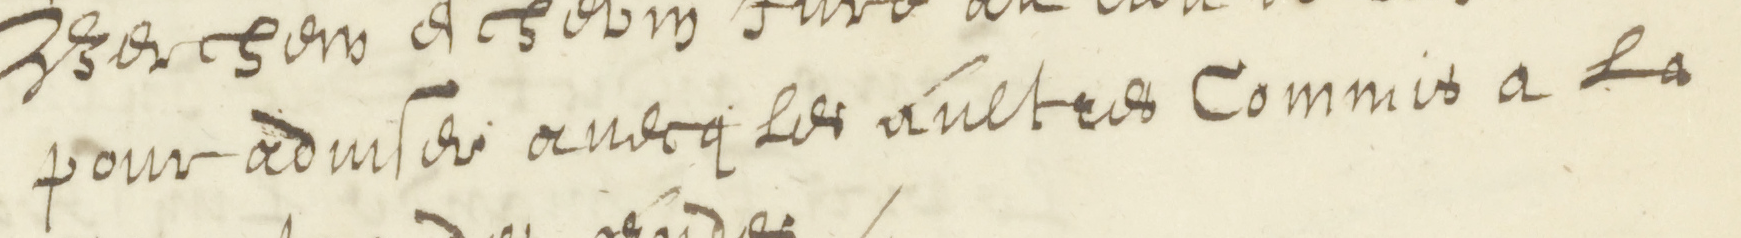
pour adviser avecq les aultres Commis a la
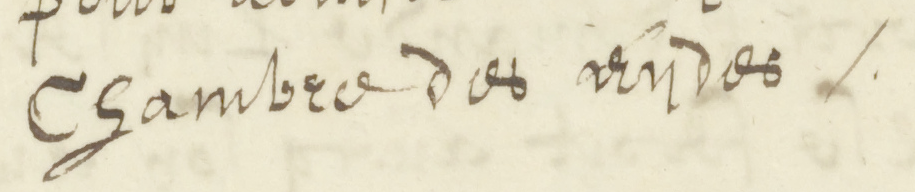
Chambre des aydes
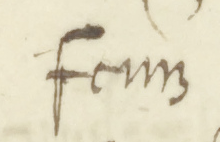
Fcmn
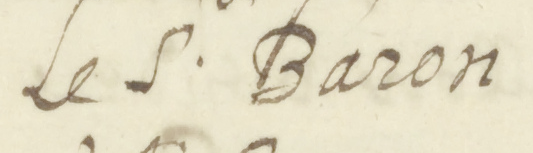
Le Sr. Baron
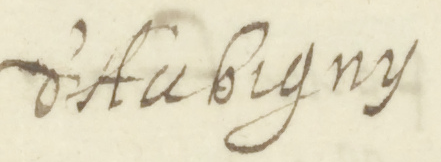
d‛Aubigny
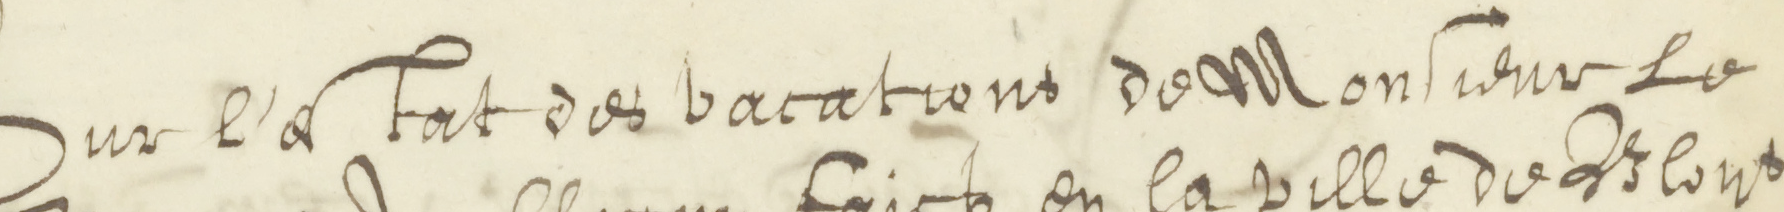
Sur l‛estat des vacations de Monsieur le
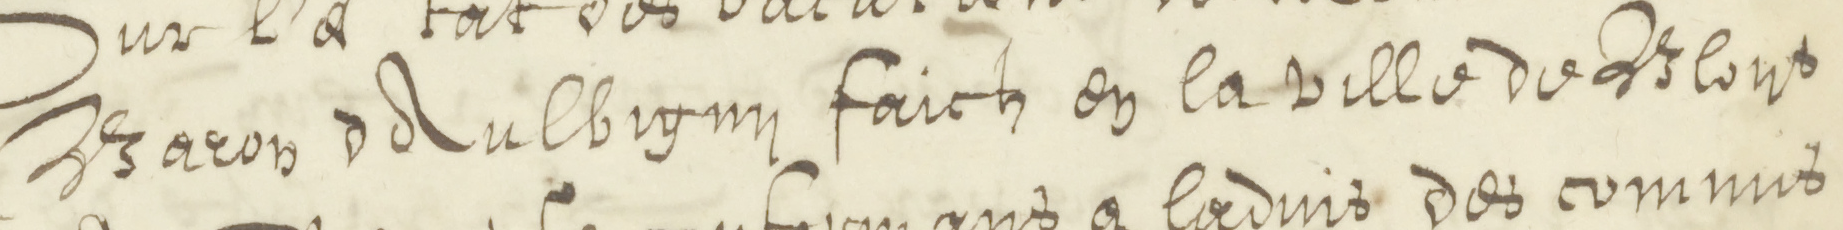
Baron d'Aulbigny faict en la ville de Bloys
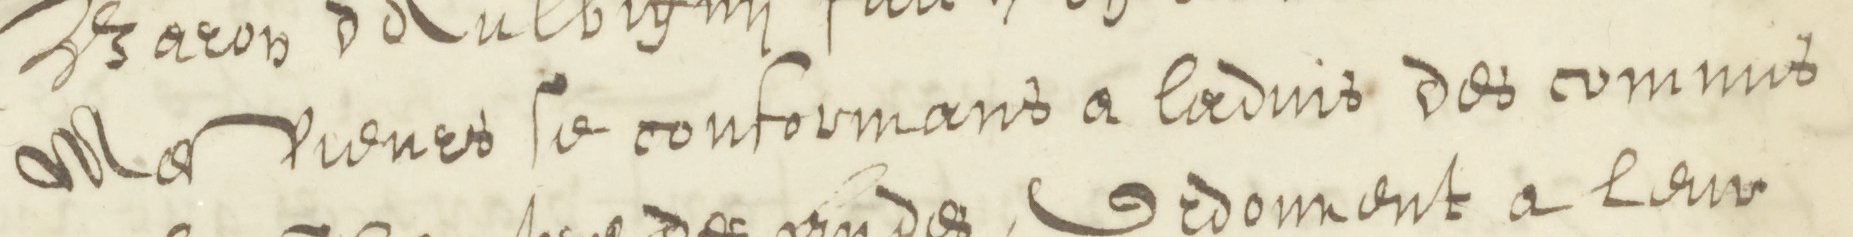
Messieurs se conformans a laduis des commis
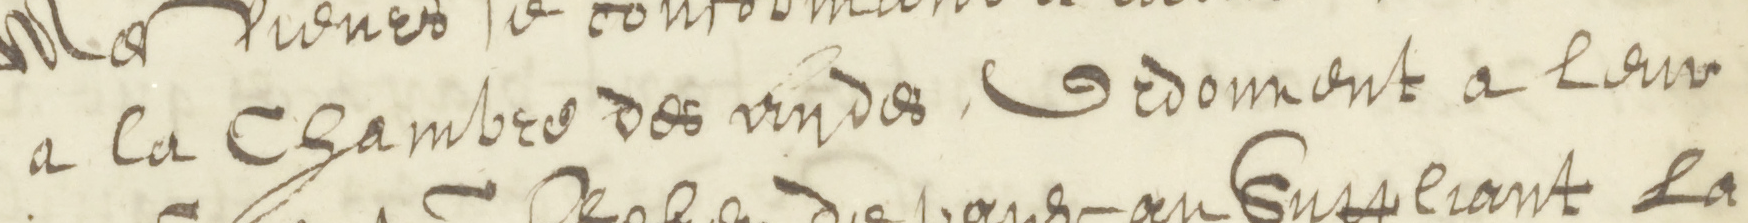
a la Chambre des aydes, Ordonnent a leur
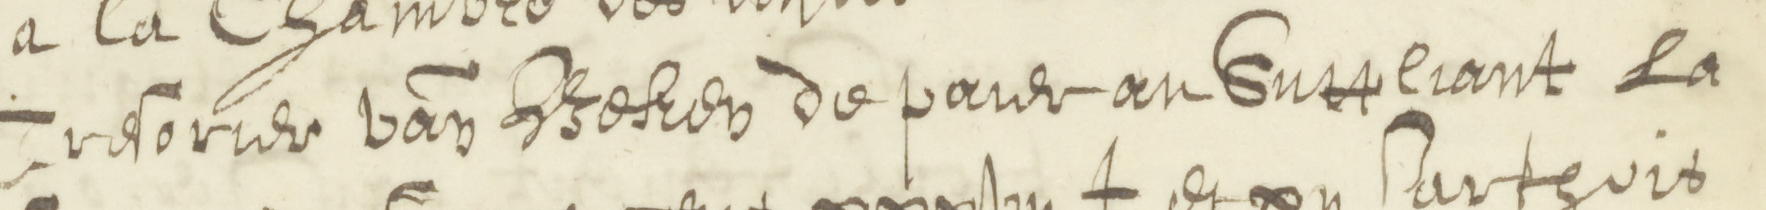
Tresorier van Beken de paier au Suppliant la
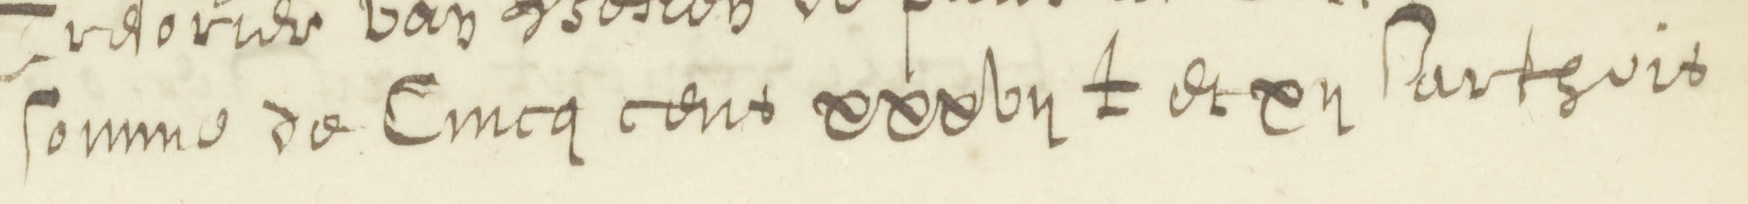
somme de Cincq cens xxxvij L et xij s arthois
